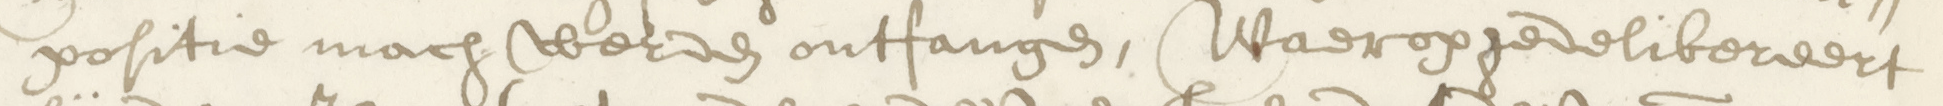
positie mach werden ontfangen. Waerop gedelibereert
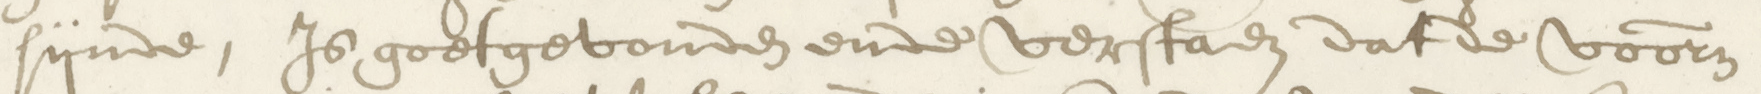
sijnde, Is goetgevonden ende verstaen dat de voorn —
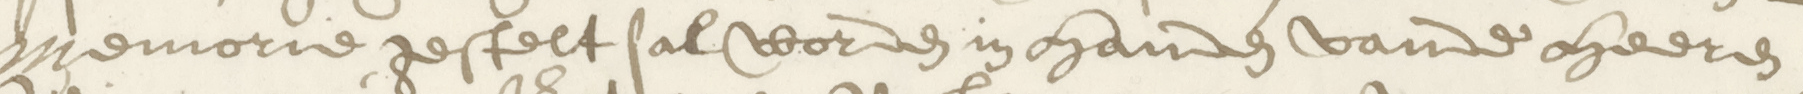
Memorie gestelt sal worden in handen vande heeren —
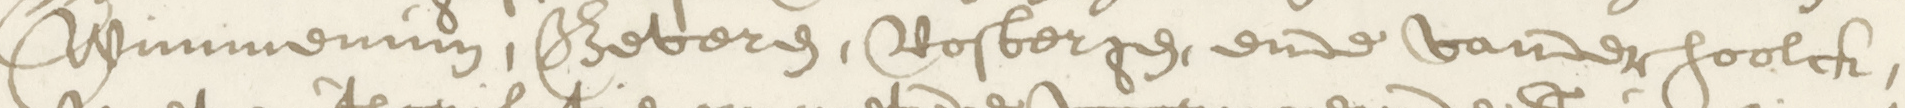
Wimmenun, Beveren, Vosbergen, ende vander hoolck,
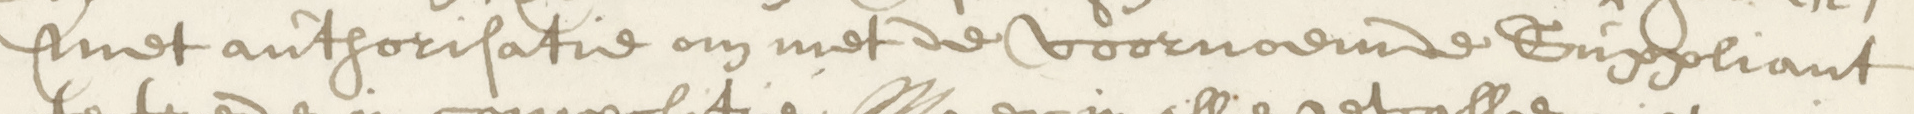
met authorisatie om met de voornoemde Suppliant
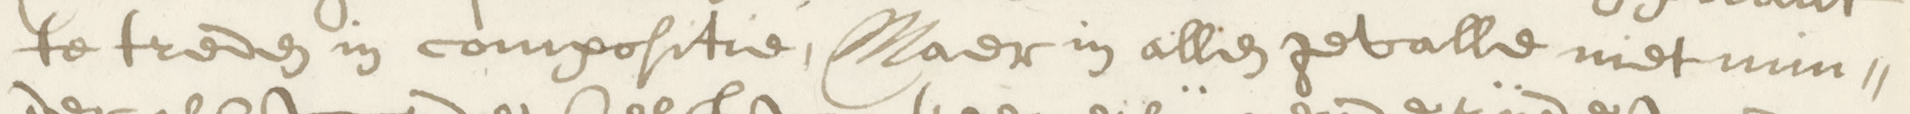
te treden in compositie, Maer in allen gevalle niet min„
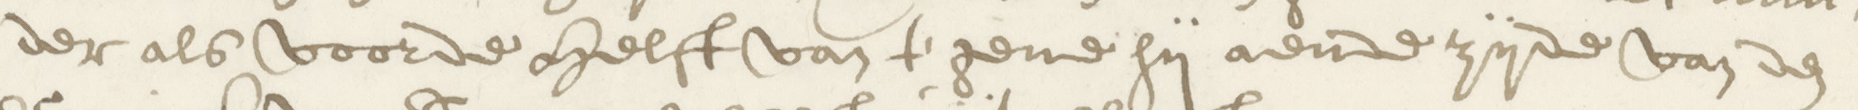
der als voorde helft van t'gene hij aende zijde van den
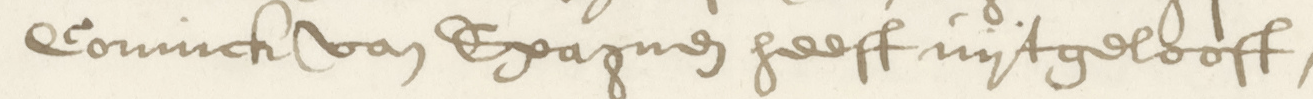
Coninck van Spagnen heeft uijtgelooft.
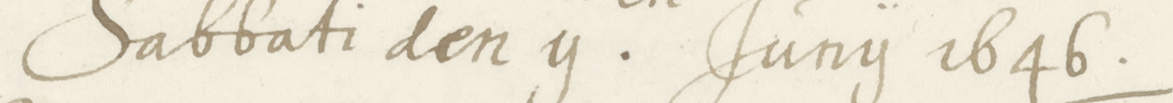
Sabbati den ijen. Junij 1646.
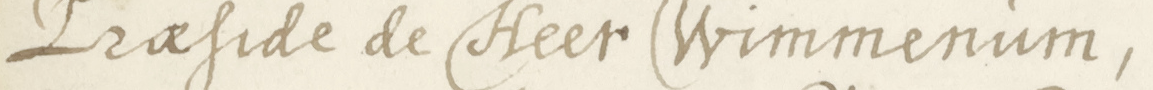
Præside de Heer Wimmenum,
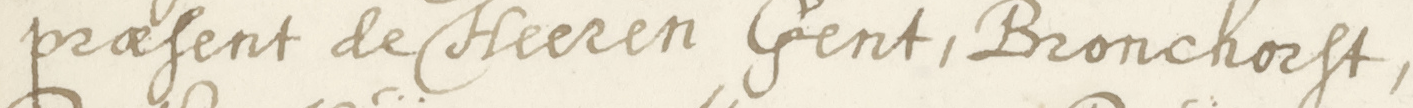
præsent de Heeren Gent, Bronchorst,
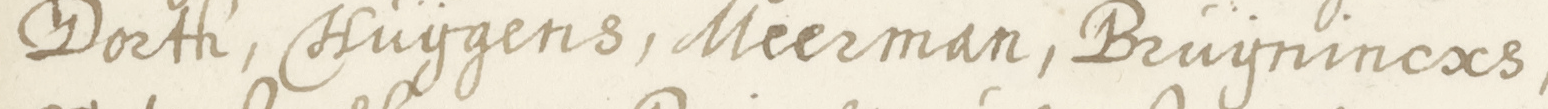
Dorth, Huijgens, Meerman, Bruijnincxs,
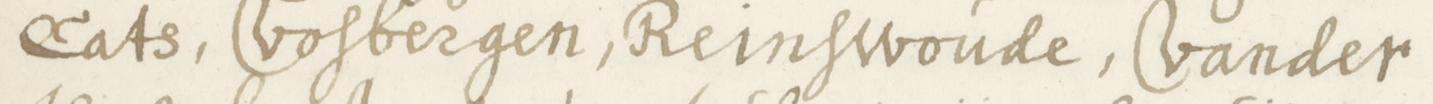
Cats, Vosbergen, Reinswoude, Vander
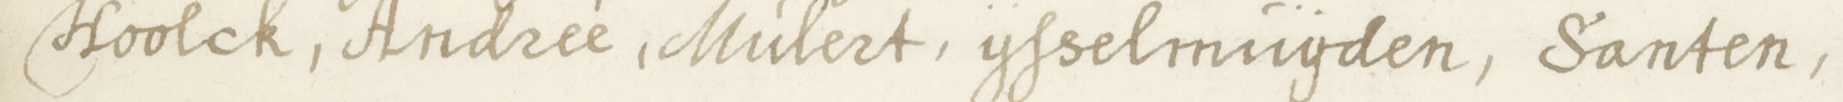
Hoolck, Andreé, Mulert, ijsselmuijden, Santen,
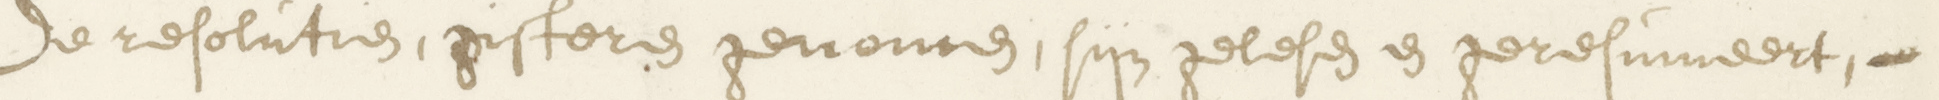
De resolutien, gisteren genomen, sijn gelesen en geresumeert, —
